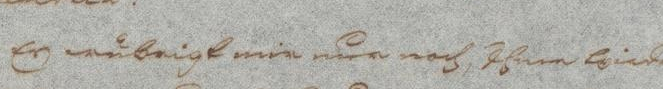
Es erübrigt mir nur noch Ihnen wieder-
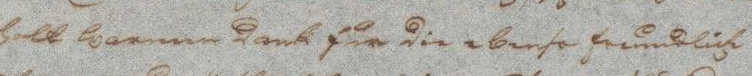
holt warmen Dank für die ebenso freundliche
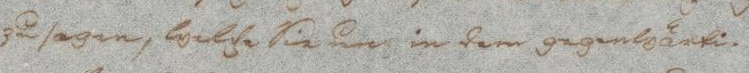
zu sagen, welche Sie uns in dem gegenwärti-
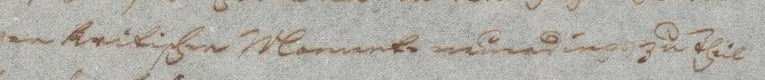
gen kritischen Momente neuerdings zu Theil
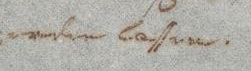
werden lassen.
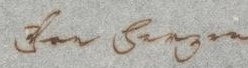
Von Herzen
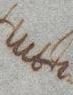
Escher
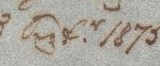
Septr 1875
